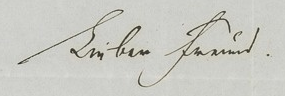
Lieber Freund.
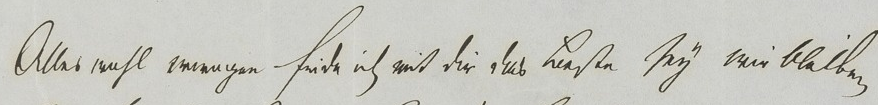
Alles wohl erwogen finde ich mit dir das Beste sey wir bleiben
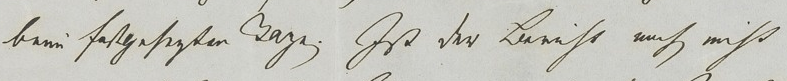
beim festgesetzten Tage. Ist der Bericht noch nicht
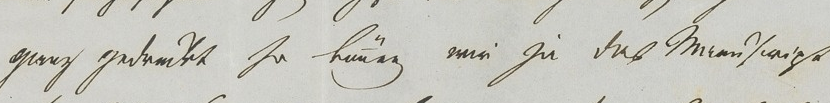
ganz gedruckt so können wir ja das Manuscript
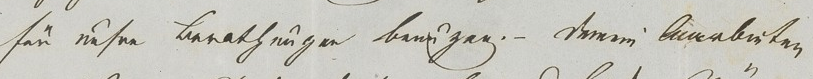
für unsre Berathungen benuzen. – Deinem Anerbieten
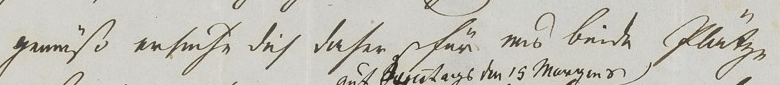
gemäß ersuche dich daher für uns beide Plätze
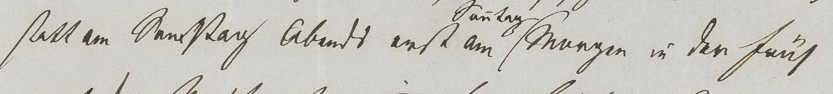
statt am Samstag Abends erst am Sonntag Morgen in der Früh
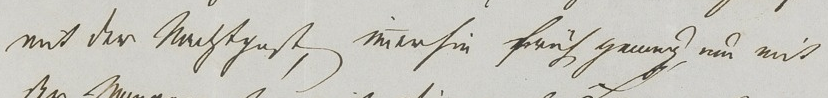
mit der Nachtpost, immerhin früh genug, um mit
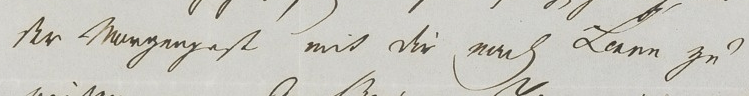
der Morgenpost mit dir nach Bern zu
